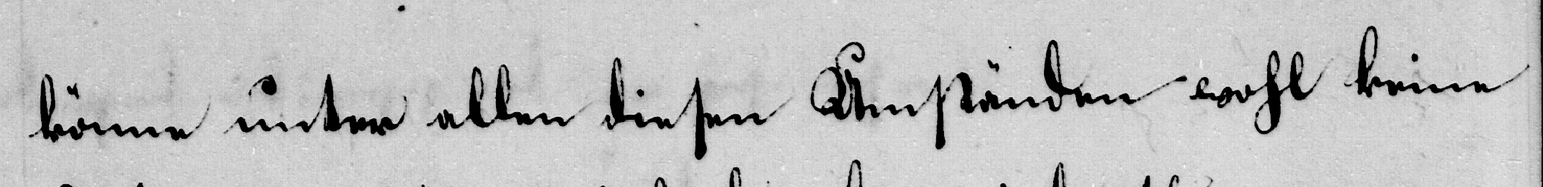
könne unter allen diesen Umständen wohl keine
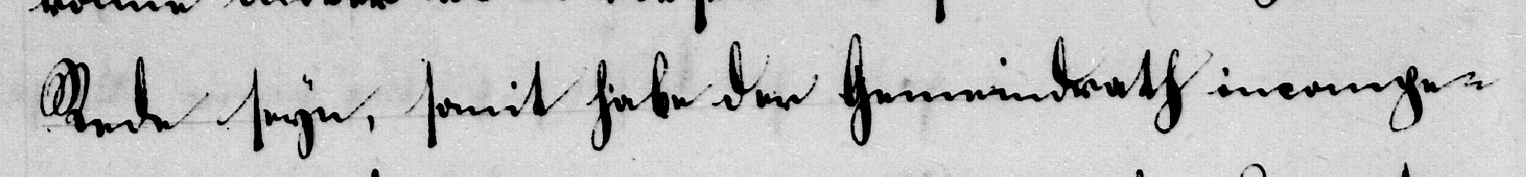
Rede seyn, somit habe der Gemeindrath incompe¬
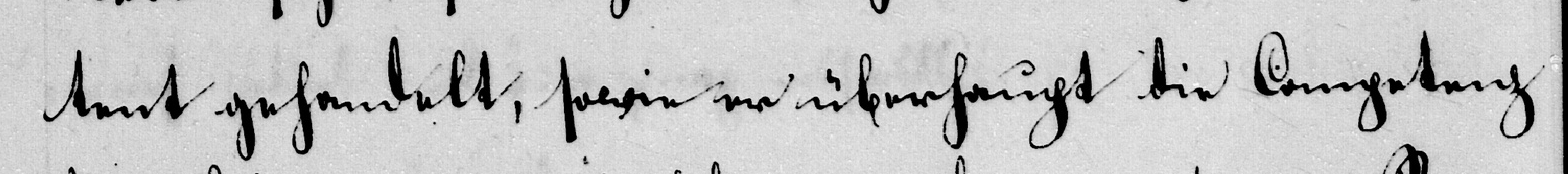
tent gehandelt, sowie er überhaupt die Competenz
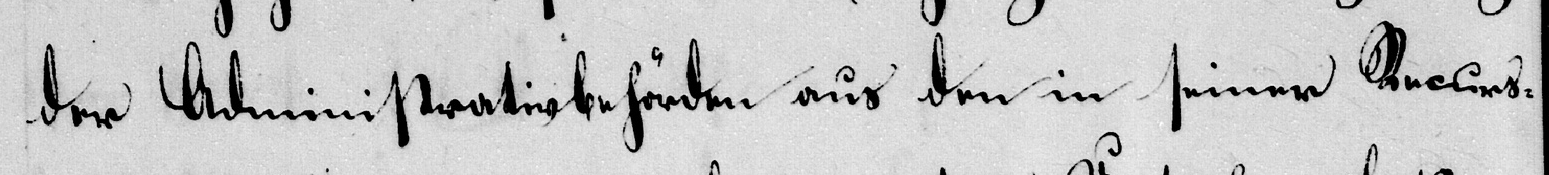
der Administrativbehörden aus den in seiner Recurs¬
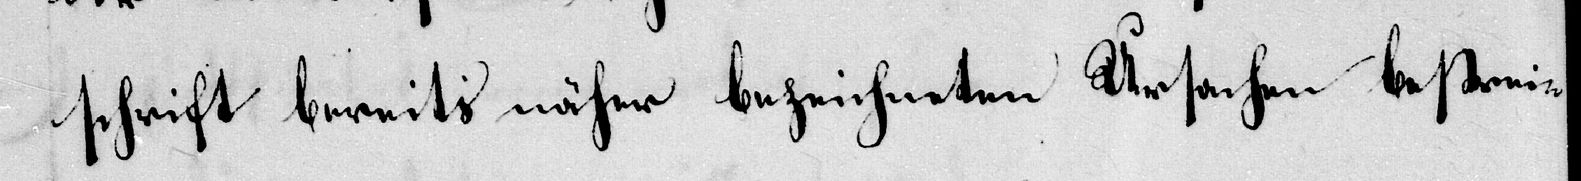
schrift bereits näher bezeichneten Ursachen bestrei¬
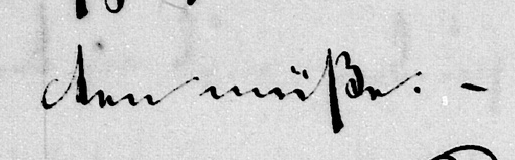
ten müße: –
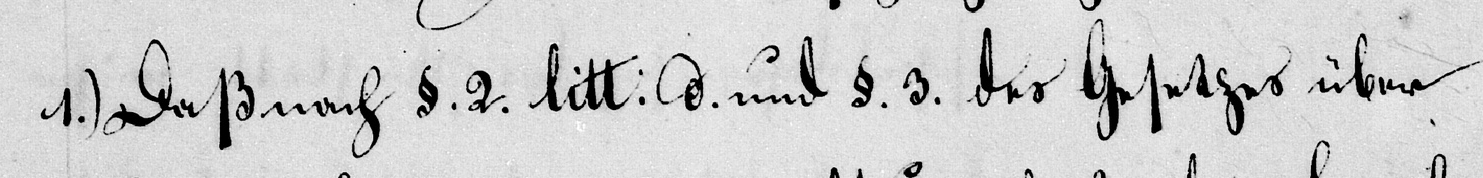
1.) Daß nach §. 2. litt: d. und §. 3. des Gesetzes über
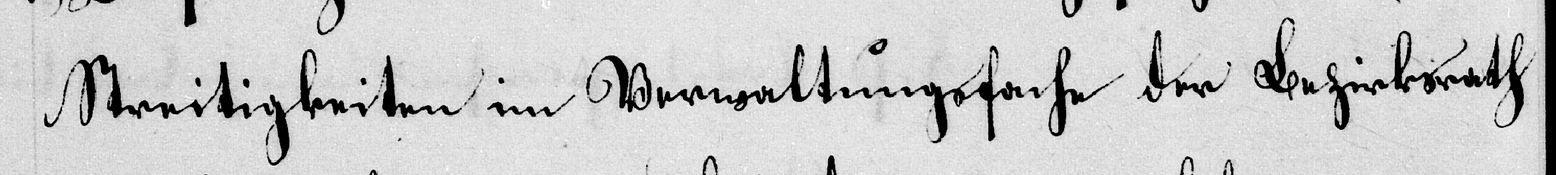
Streitigkeiten im Verwaltungsfache der Bezirksrath
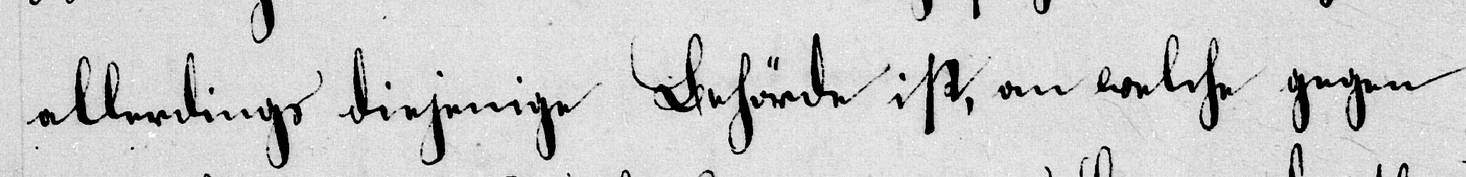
allerdings diejenige Behörde ist, an welche gegen
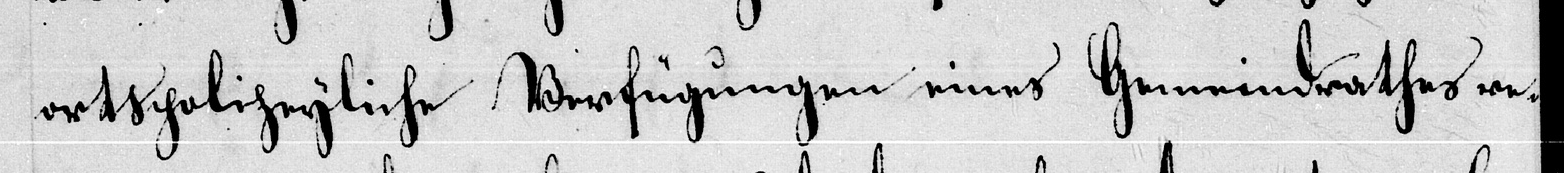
ortspolizeyliche Verfügungen eines Gemeindrathes re¬
